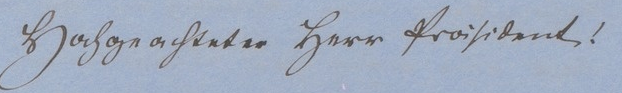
Hochgeachteter Herr Präsident!
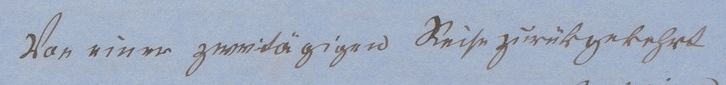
Von einer zweitägigen Reise zurükgekehrt
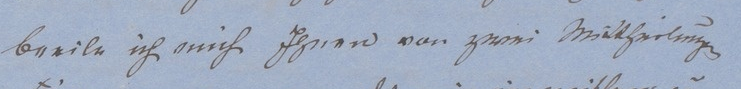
beeile ich mich Ihnen von zwei Mittheilungen
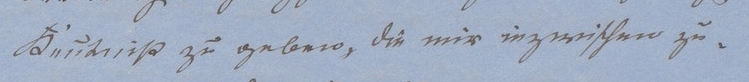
Kenntniß zu geben, die mir inzwischen zu-
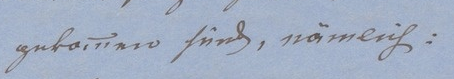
gekommen sind, nämlich:
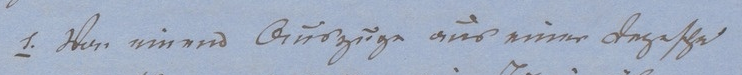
1. Von einem Auszuge aus einer Depesche
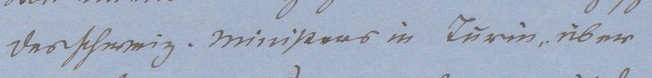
des schweiz. Ministers in Turin, über
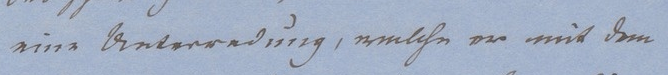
eine Unterredung, welche er mit dem
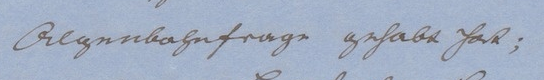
Alpenbahnfrage gehabt hat;
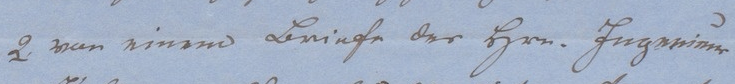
2. von einem Briefe des Hrn. Ingenieur
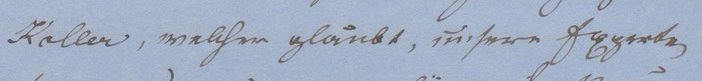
Koller, welcher glaubt, unsere Experten
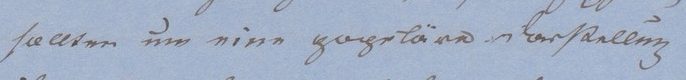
sollten um eine populäre Darstellung
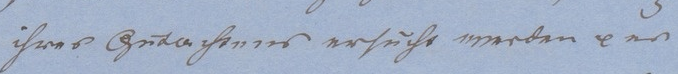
ihres Gutachtens ersucht werden & es
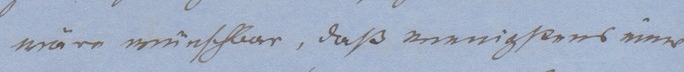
wäre wünschbar, daß wenigstens einer
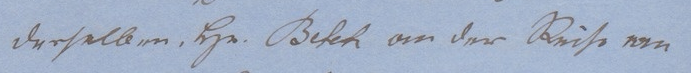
derselben, Hr. Bekh an der Reise an
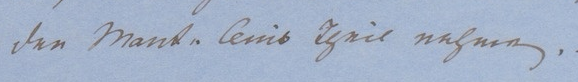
den Mont-Cenis Theil nehme. –
